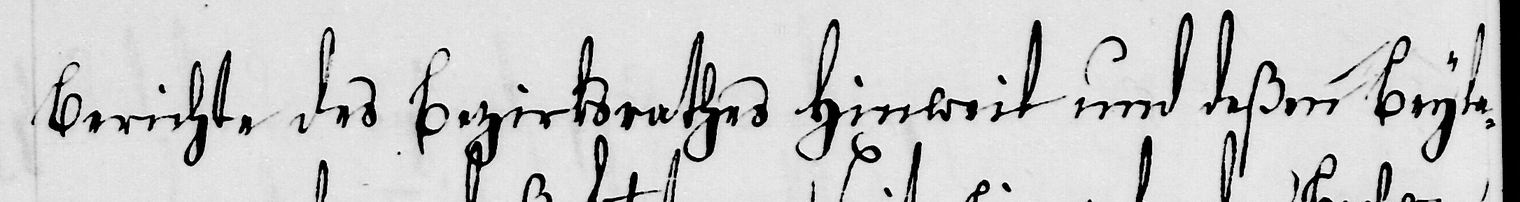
Berichte des Bezirksrathes Hinweil und deßen Beyla¬
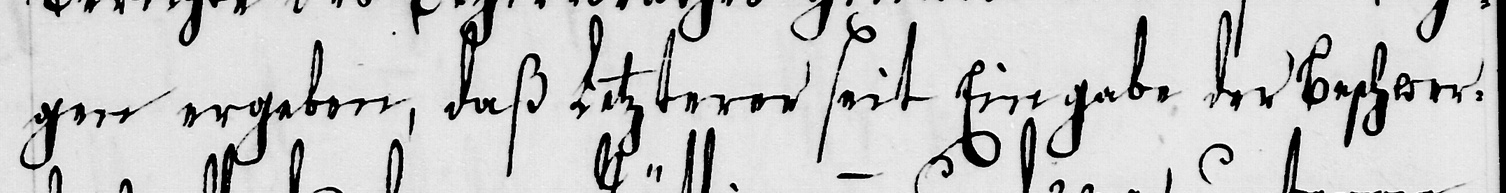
gen ergeben, daß Letzterer seit Eingabe der Beschwer¬
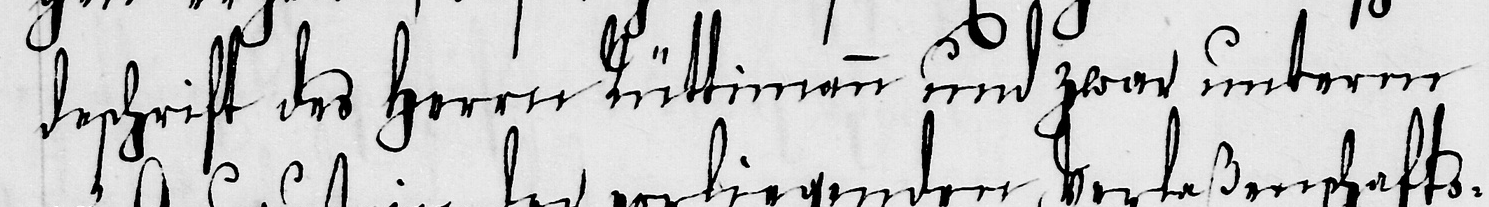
deschrift des Herrn Rüttimann und zwar unterm
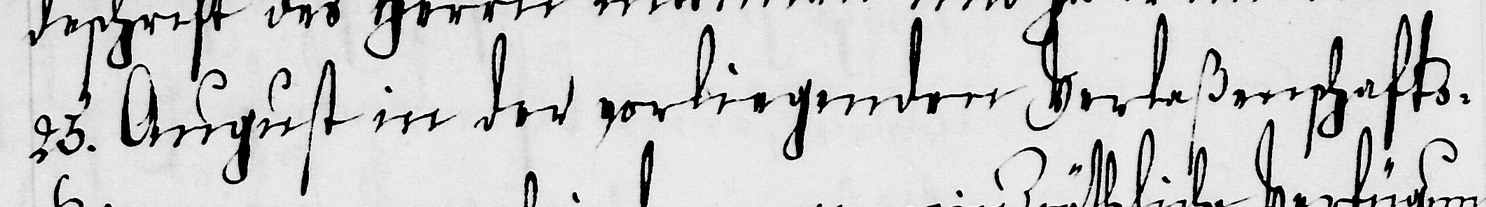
23. August in der vorliegenden Verlaßenschafts¬
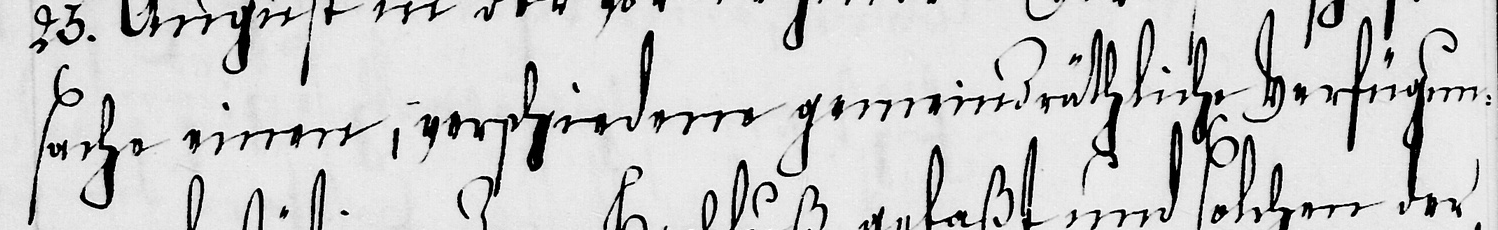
sache einen, verschiedene gemeindräthliche Verfügun¬
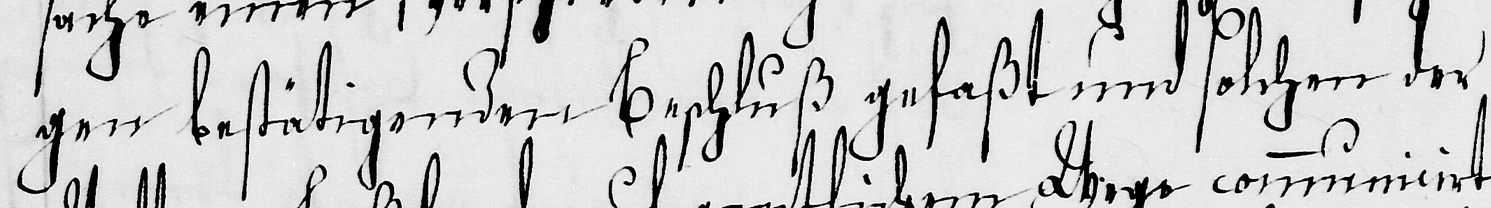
gen bestätigenden Beschluß gefaßt und solchen der
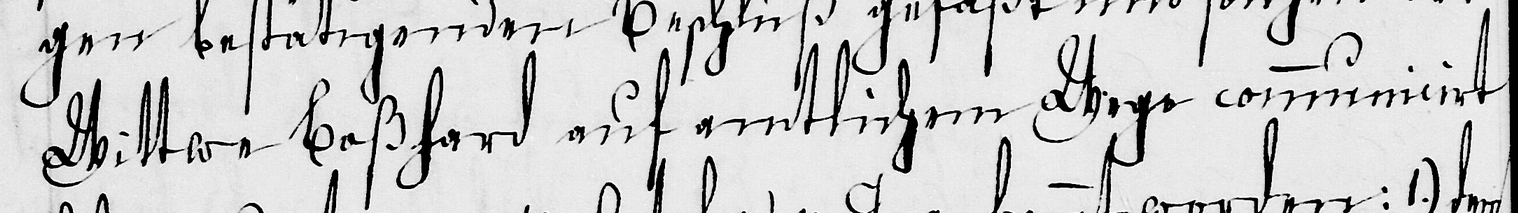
Wittwe Boßhard auf amtlichem Wege communicirt
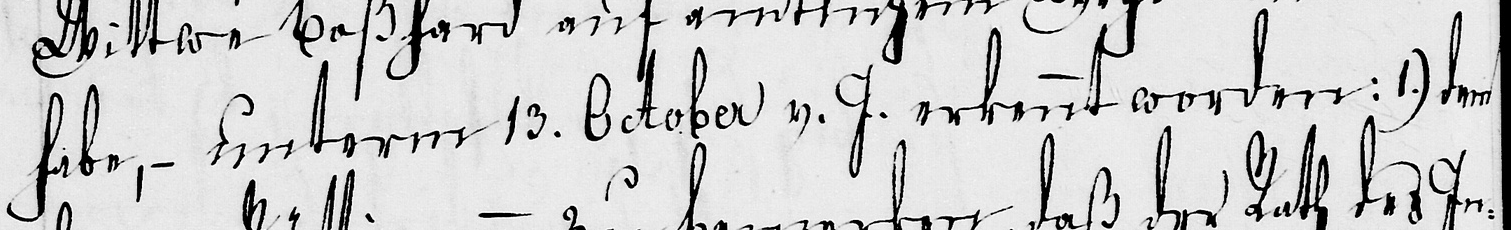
habe, – unterm 13. October v. J. erkennt worden: 1.) dem
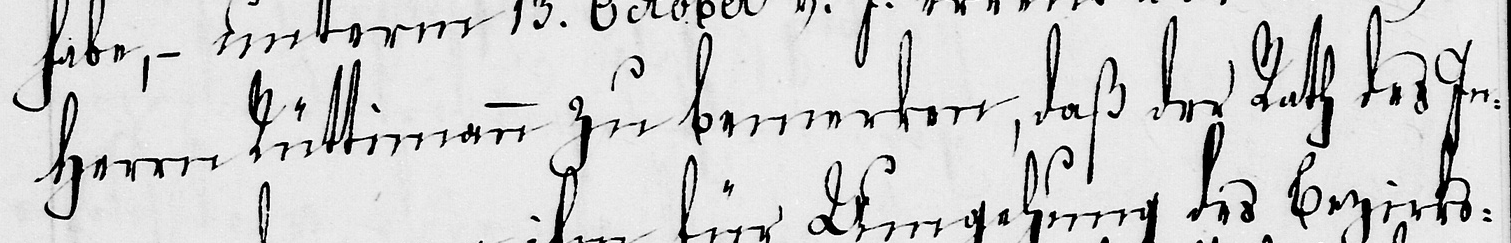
Herrn Rüttimann zu bemerken, daß der Rath des I¬
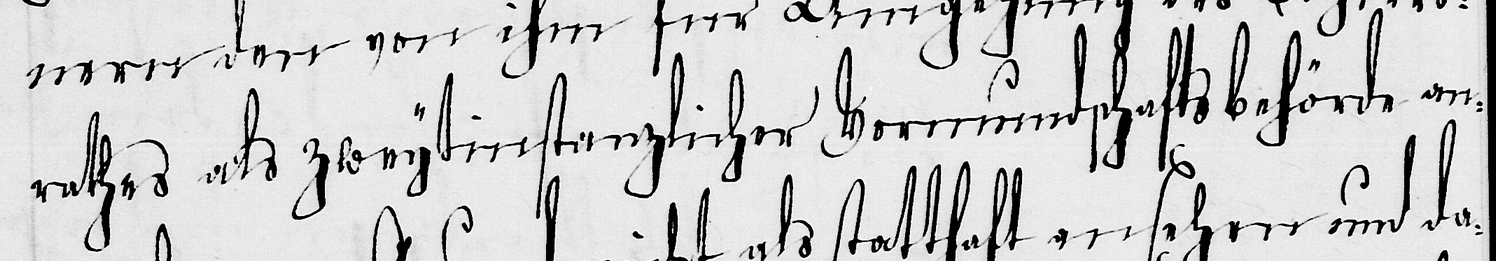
rathes als zweytinstanzlicher Vormundschaftsbehörde a¬
